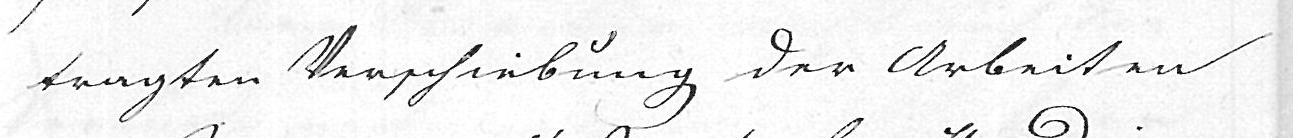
tragten Verschiebung der Arbeiten
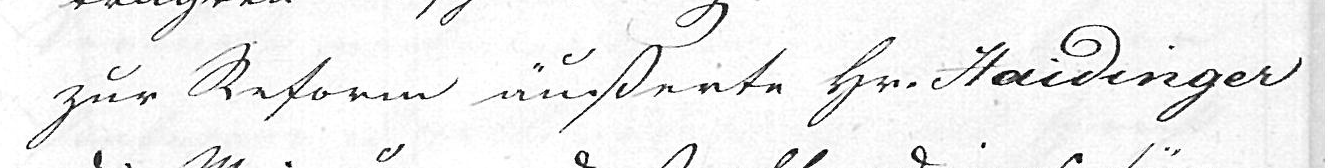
zur Reform äußerte Hr. Haidinger
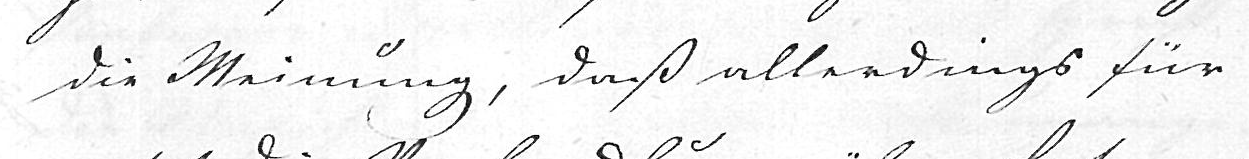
die Meinung, daß allerdings für
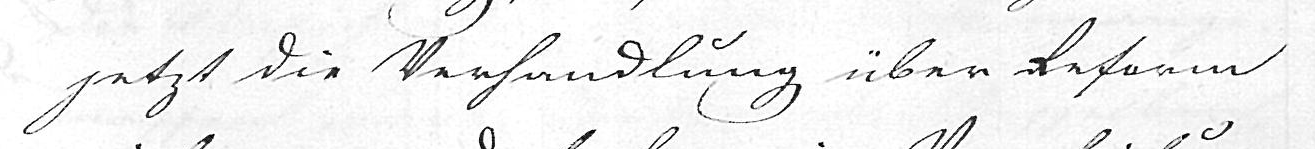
jetzt die Verhandlung über Reform
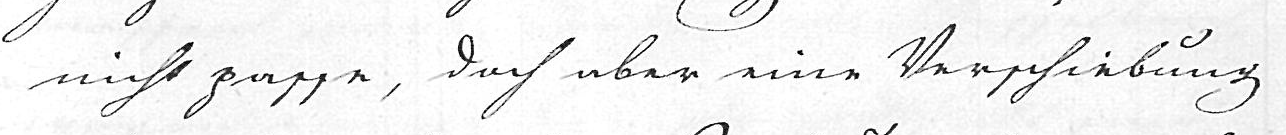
nicht passe, doch aber eine Verschiebung
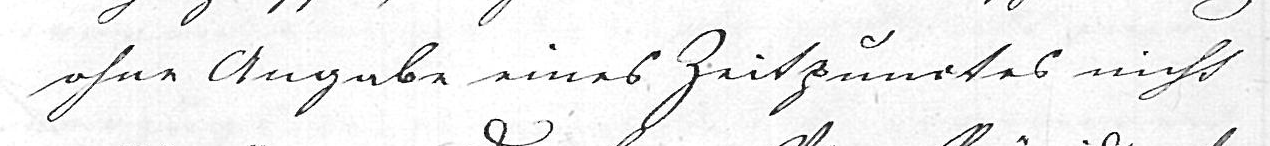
ohne Angabe eines Zeitpunctes nicht
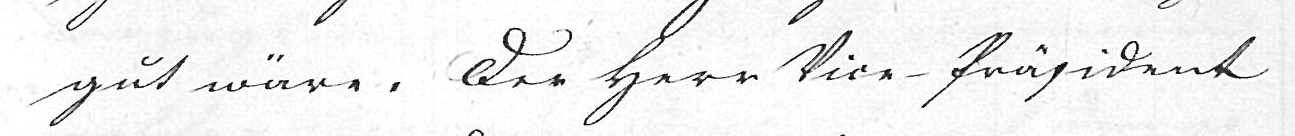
gut wäre. Der Herr Vice-Präsident
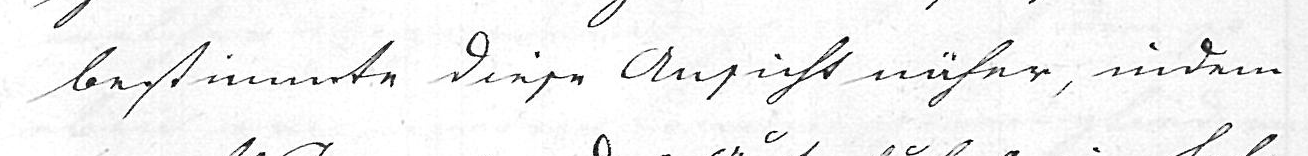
bestimmte diese Ansicht näher, indem
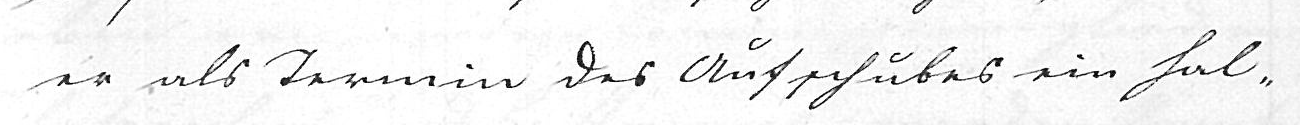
er als Termin des Aufschubes ein hal-
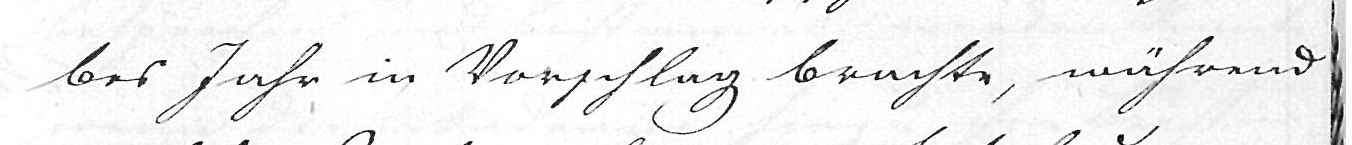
bes Jahr in Vorschlag brachte, während
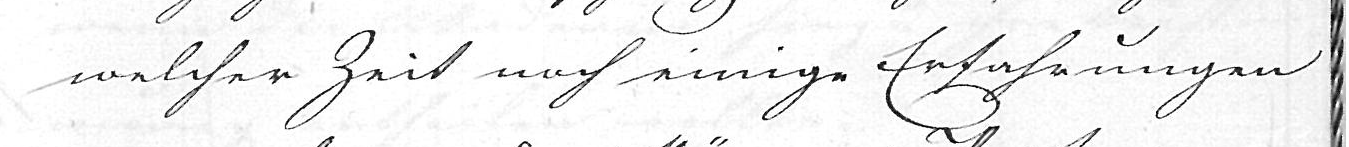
welcher Zeit noch einige Erfahrungen
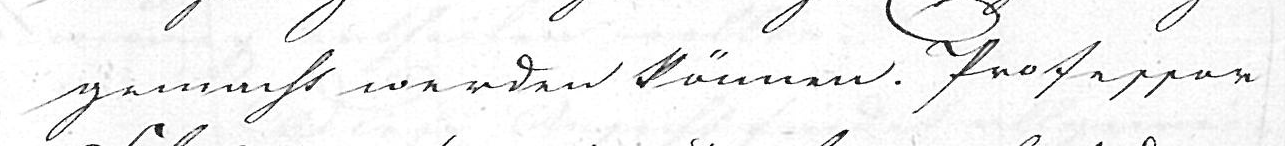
gemacht werden können. Professor
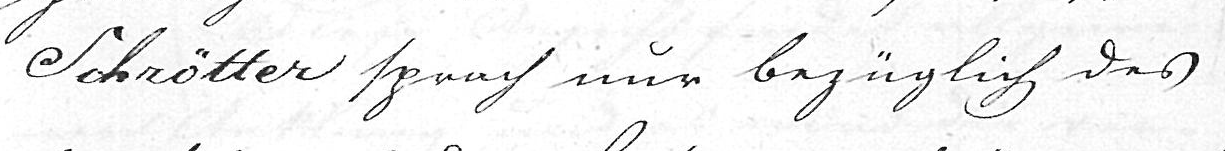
Schrötter sprach nur bezüglich des
